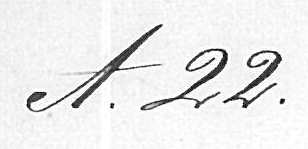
A. 22.
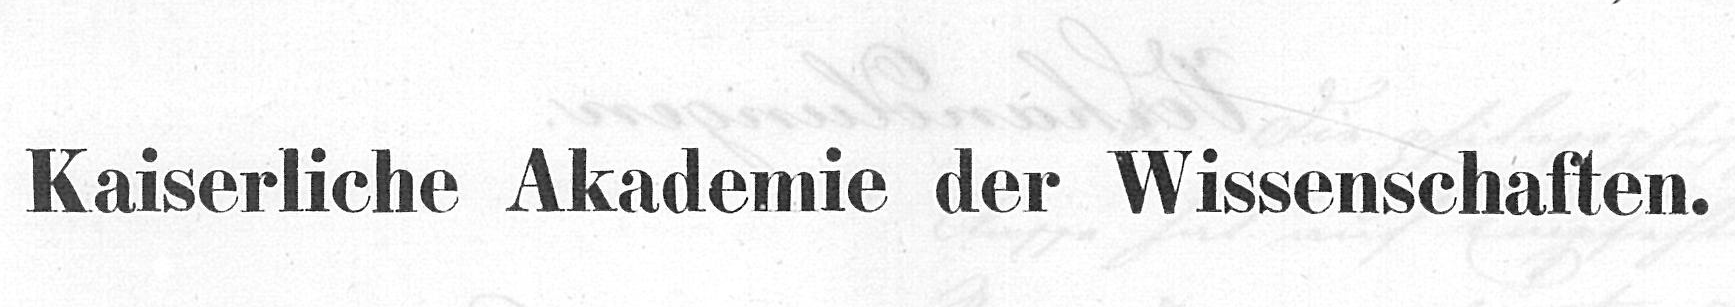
Kaiserliche Akademie der Wissenschaften.
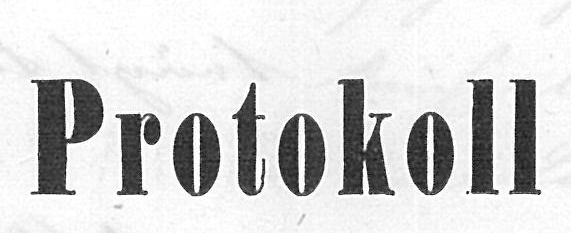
Protokoll
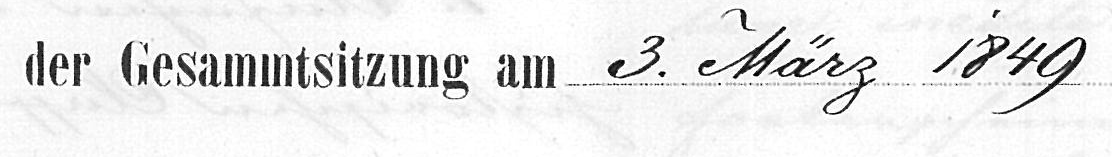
der Gesammtsitzung am 3. März 1849
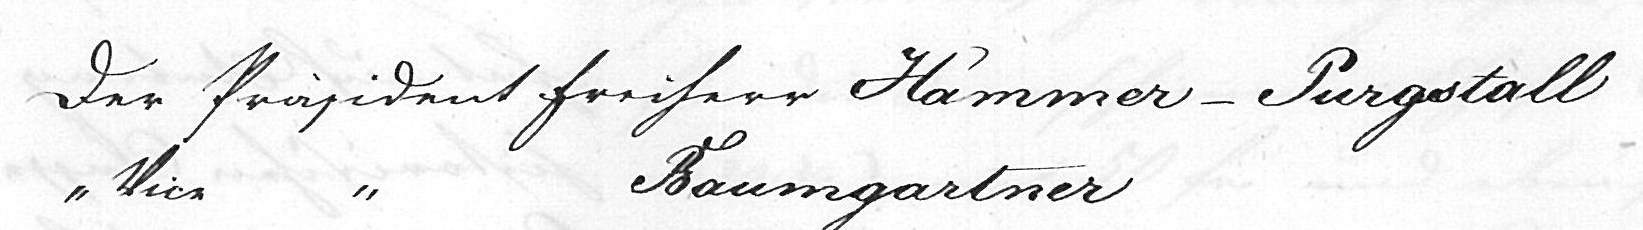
Der Präsident Freiherr Hammer-Purgstall
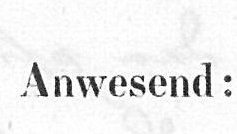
Anwesend:
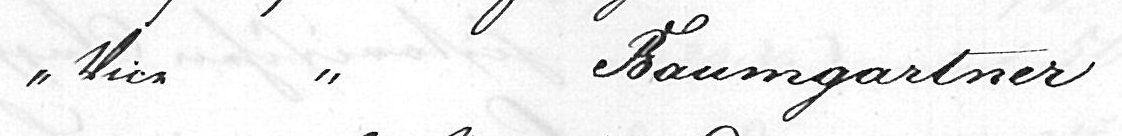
" Vice " Baumgartner
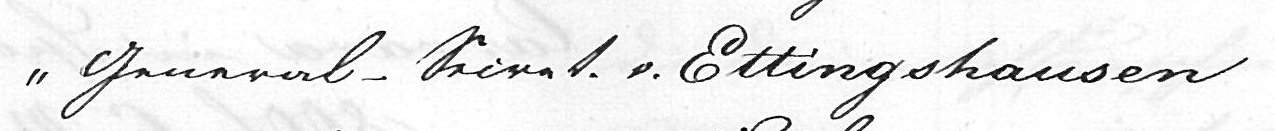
" General-Secret. v. Ettingshausen
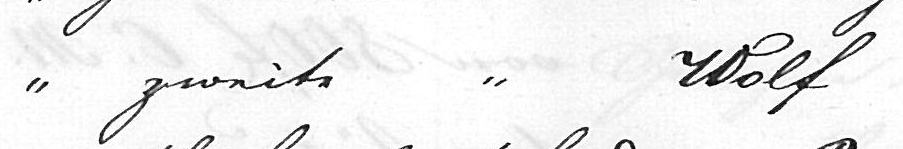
" zweite " Wolf
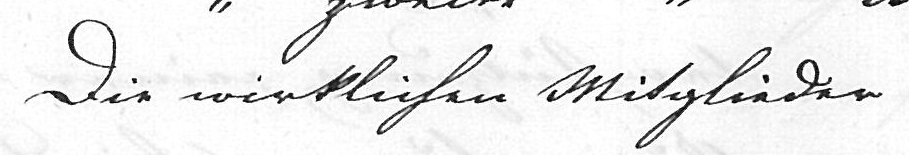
Die wirklichen Mitglieder
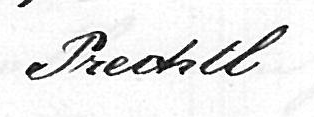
Prechtl
